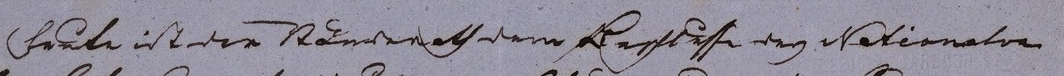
Heute ist der Ständerath dem Beschlusse des Nationalra-
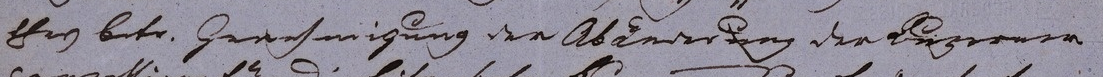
thes betr. Genehmigung der Abänderung der Luzerner
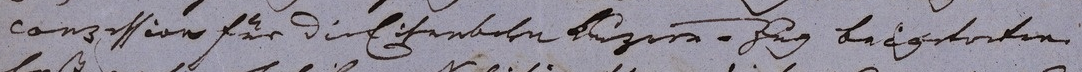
Conzession für die Eisenbahn Luzern–Zug beigetreten.
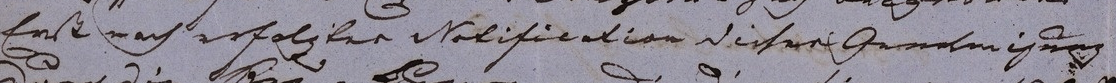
Erst nach erfolgter Notification dieser Genehmigung
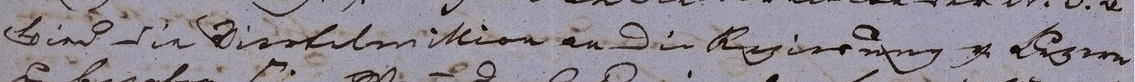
wird die Viertelmillion an die Regierung v. Luzern
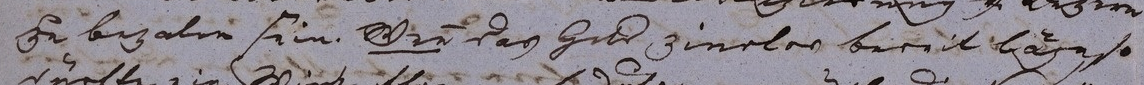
zu bezalen sein. Wenn das Geld zinslos bereit läge, so
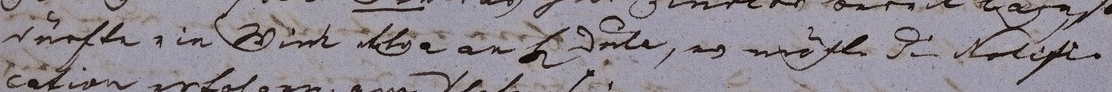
dürfte ein Wink etwa an Herrn Dula, es möchte die Notifi-
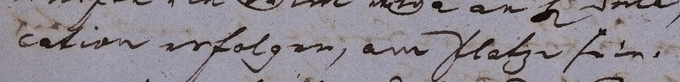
cation erfolgen, am Platze sein.
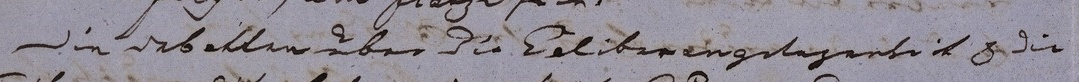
Die Debatten über die Caliberangelegenheit & die
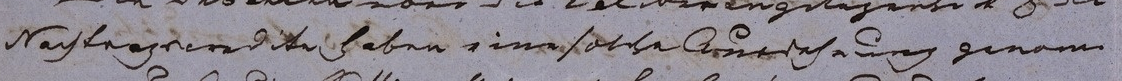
Nachtragscredite haben eine solche Ausdehnung genom-
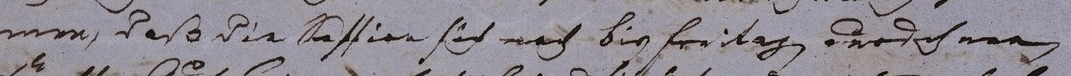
men, daß die Session sich noch bis Freitag ausdehnen
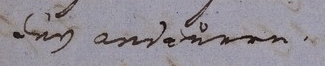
aus andauern.
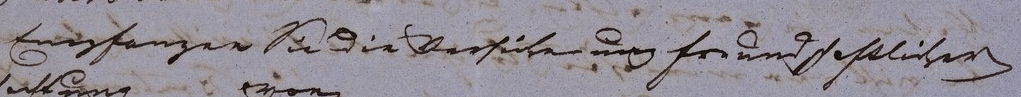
Empfangen Sie die Versicherung freundschaftlicher
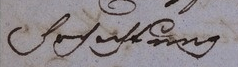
Hochachtung
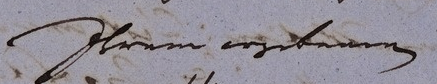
Ihrem ergebenen
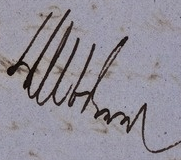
Escher
